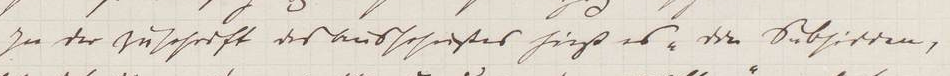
In der Zuschrift des Ausschußes hieß es «die Subsidien,
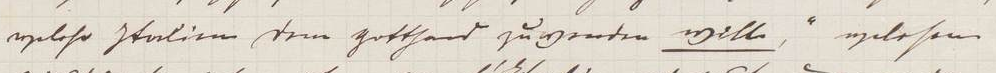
welche Italien dem Gotthard zuwenden will,» welchen
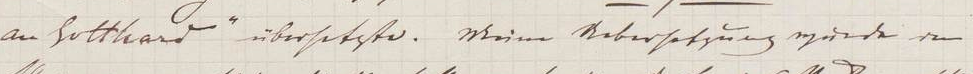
au Gotthard » übersetzte. Meine Uebersetzung wurde in
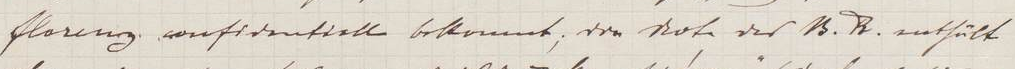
Florenz confidentiell bekannt, die Note des B.R. enthält
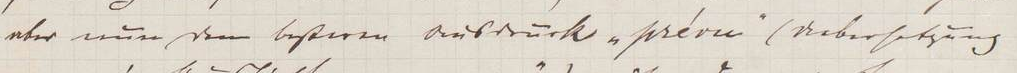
aber nun den beßeren Ausdruck «prévu» (Uebersetzung
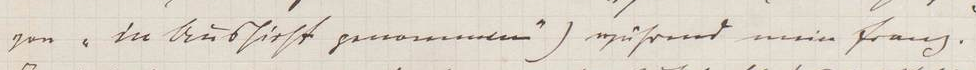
von «in Aussicht genommen») während mein franz.
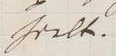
hielt.
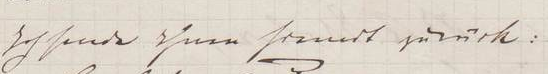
Ich sende Ihnen hiemit zurück:
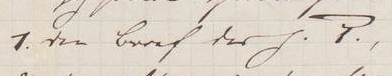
1. den Brief des H. P.,
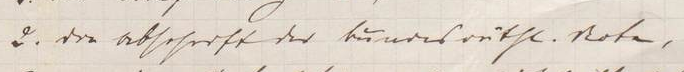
2. die Abschrift der bundesräthl. Note,
